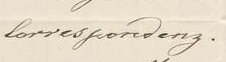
Korrespondenz.
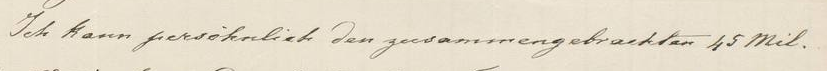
Ich kann persöhnlich den zusammengebrachten 45 Mil.
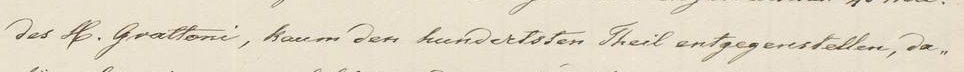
des H. Grattoni, kaum den hundertsten Theil entgegenstellen, da-
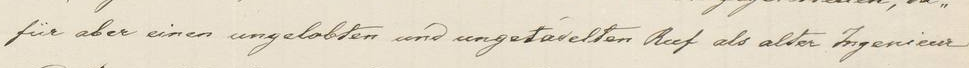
für aber einen ungelobten und ungetadelten Ruf als alter Ingenieur
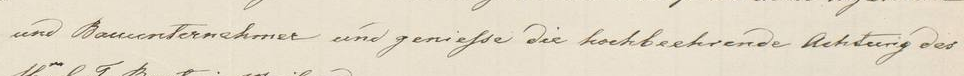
und Bauunternehmer und geniesse die hochbeehrende Achtung des
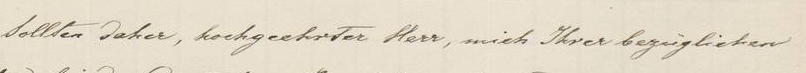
Sollten daher, hochgeehrter Herr, mich Ihrer bezüglichen
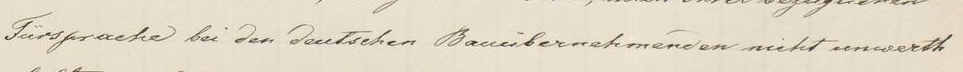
Fürsprache bei den deutschen Bauübernehmenden nicht unwerth
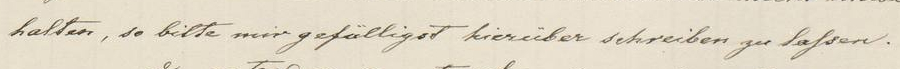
halten, so bitte mir gefälligst hierüber schreiben zu lassen.
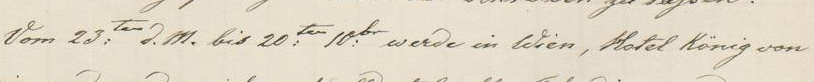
Vom 23ten d. M. bis 20ten 10br werde in Wien, Hotel König von
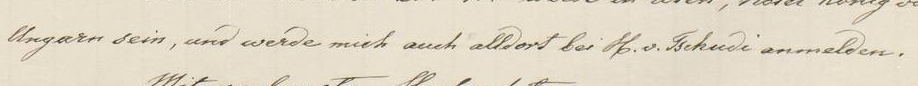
Ungarn sein, und werde mich auch alldort bei H. v. Tschudi anmelden.
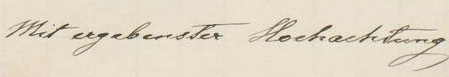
Mit ergebenster Hochachtung
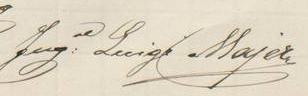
Ingre Luigi Majer
